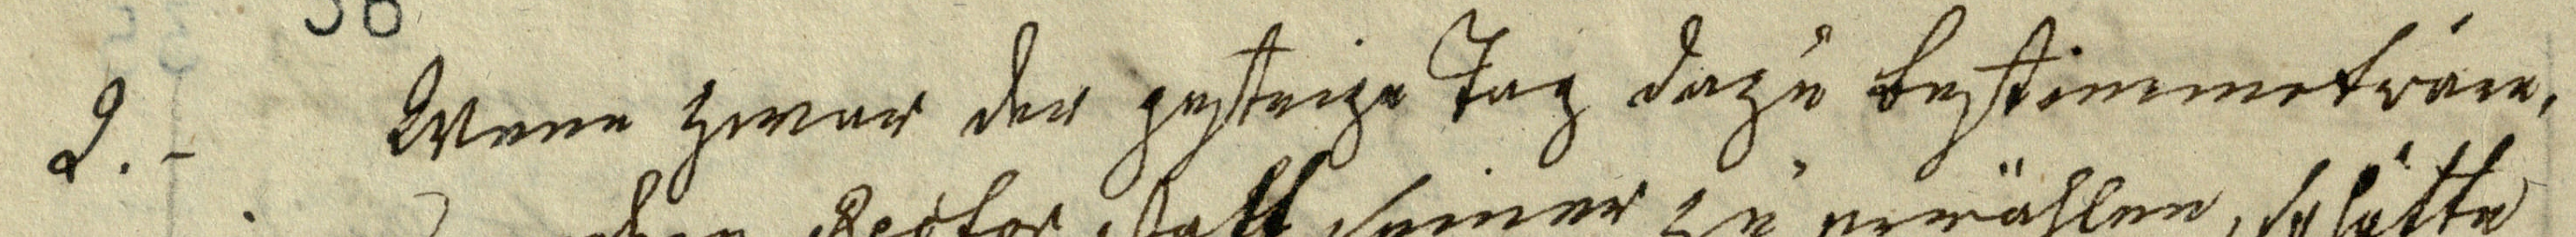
2. Wenn zwar der gestrige Tag dazu bestimmet wäre,
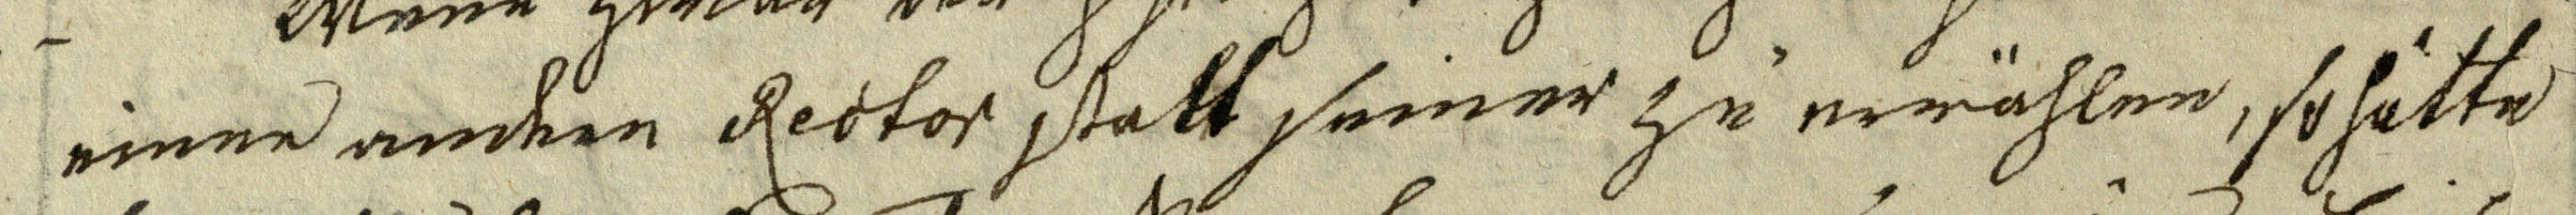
einen andern Rector statt seiner zu erwählen, so hätte
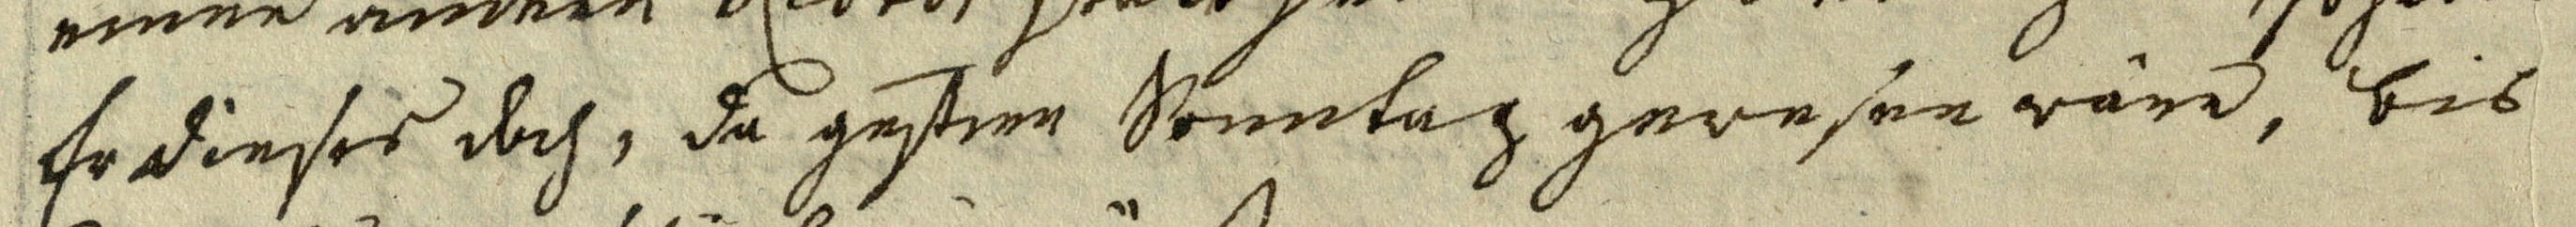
Er dieses doch, da gestern Sonntag gewesen wäre, bis
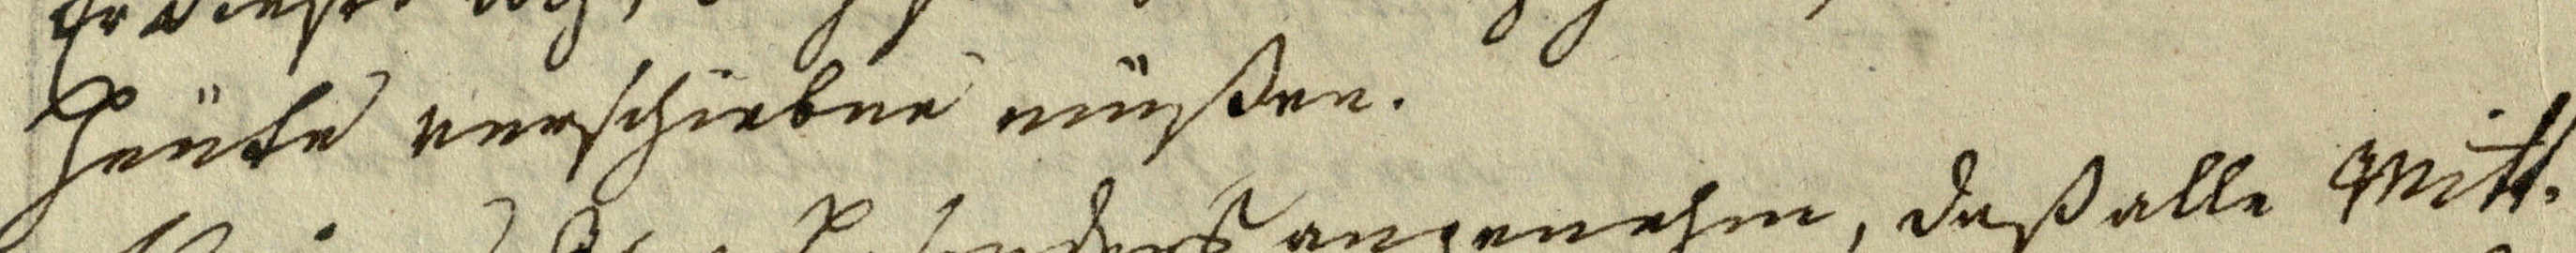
heute verschieben müssen.
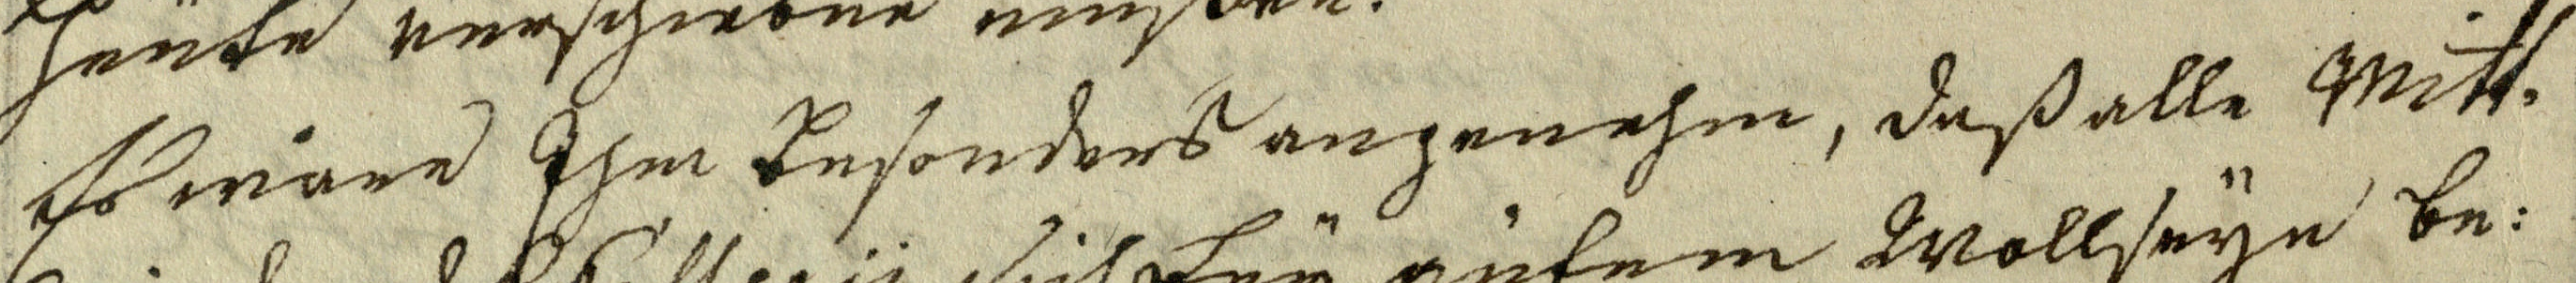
Es wäre Ihm besonders angenehm, daß alle Mitt¬
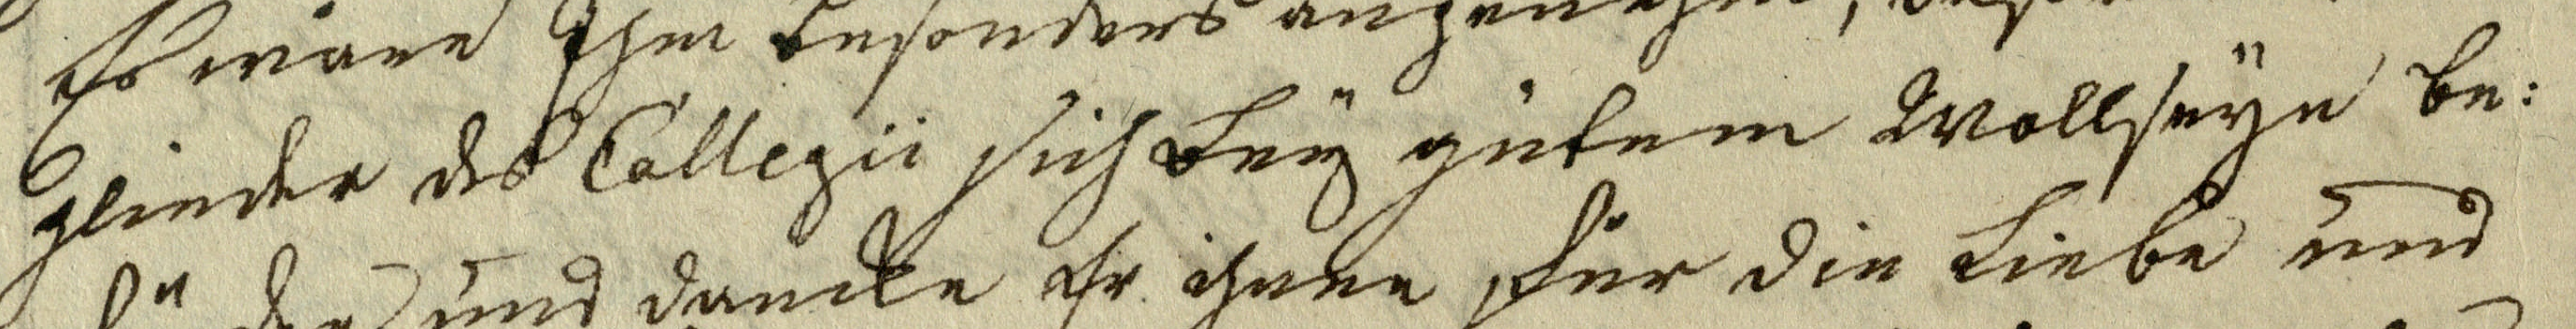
glieder des Collegii sich beÿ gutem Wohlseÿn be¬
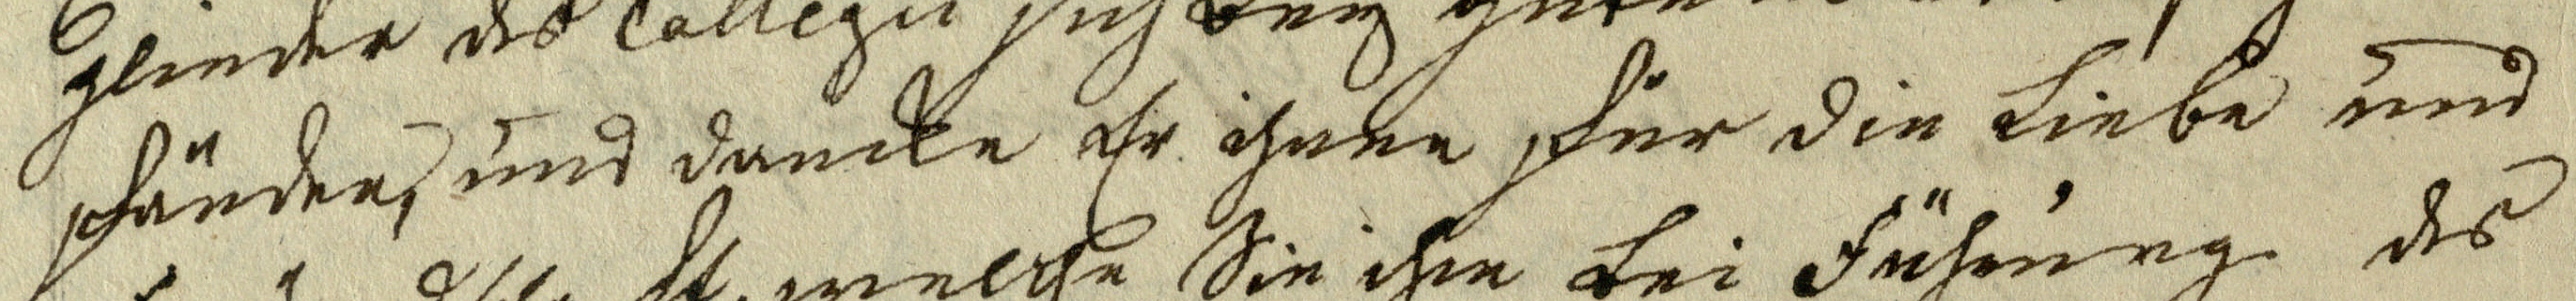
fänden, und dancke Er ihnen für die Liebe und
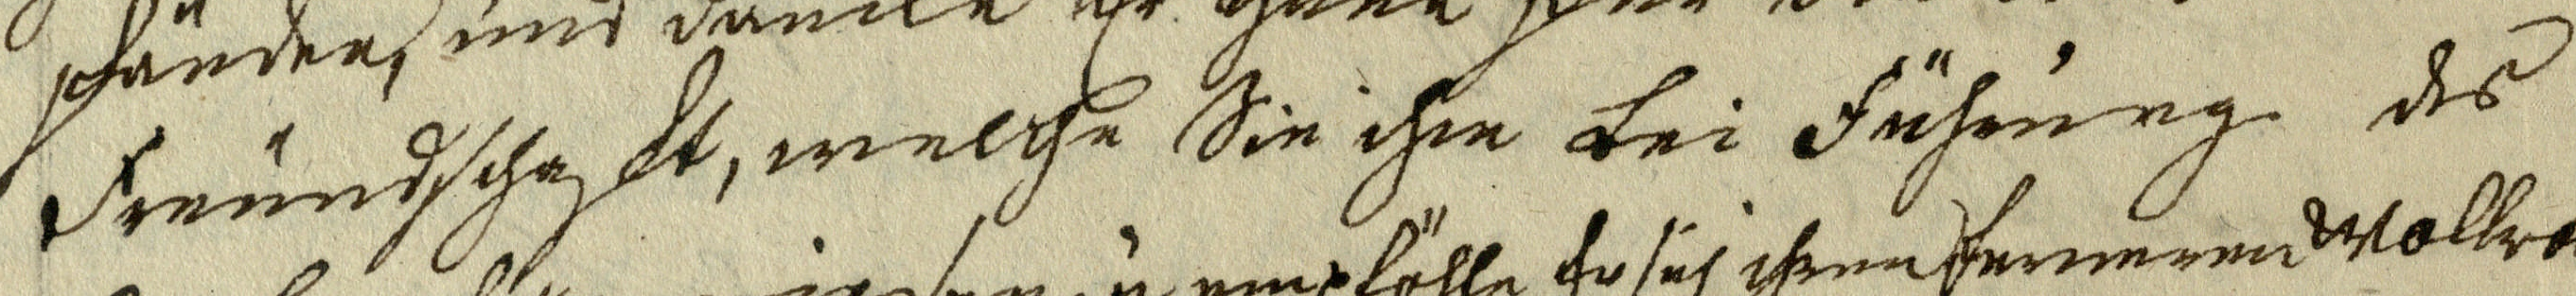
Freundschaft, welche Sie ihm bei Führung des
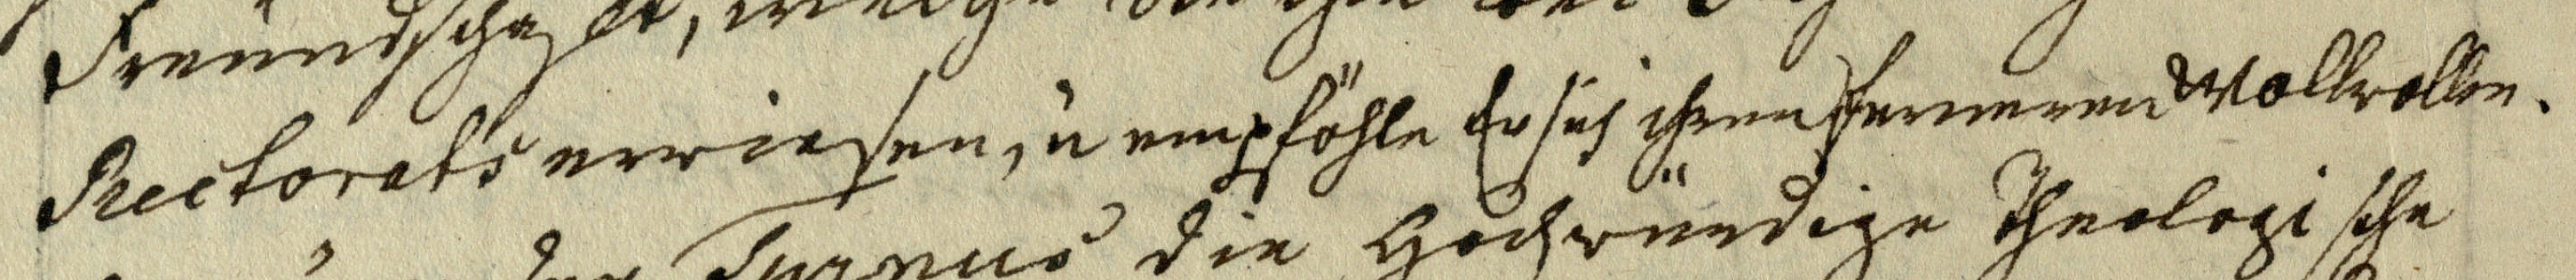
Rectorats erwiesen, u empföhle Er sich ihrem ferneren Wohlwollen.
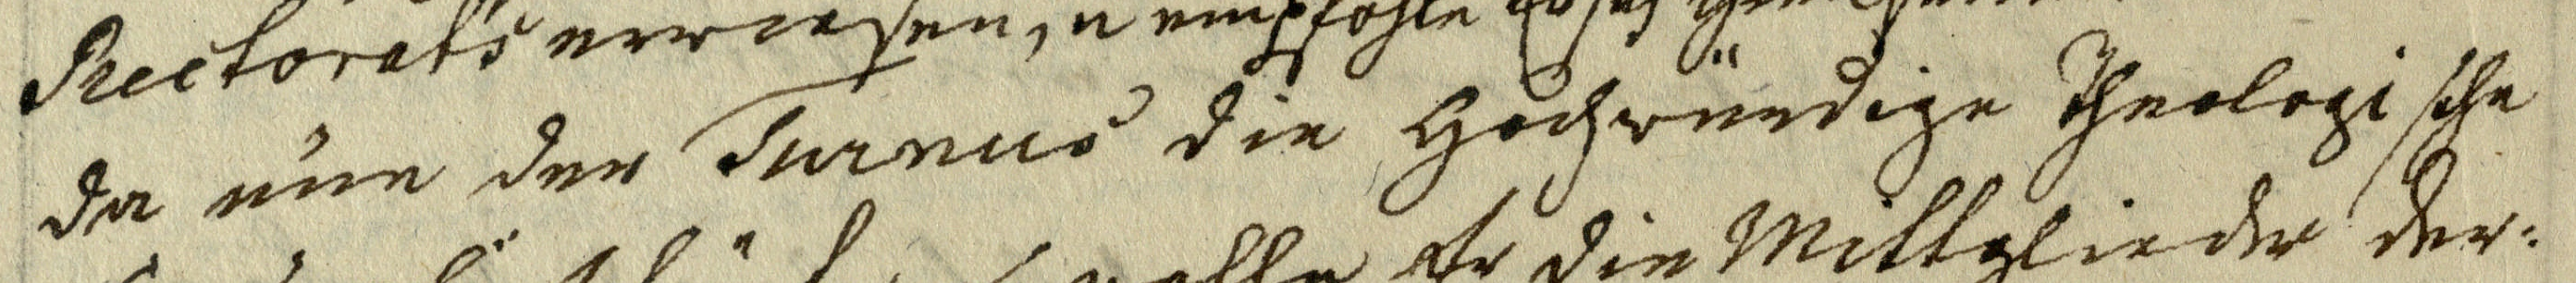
Da nun der Turnus die Hochwürdige Theologische
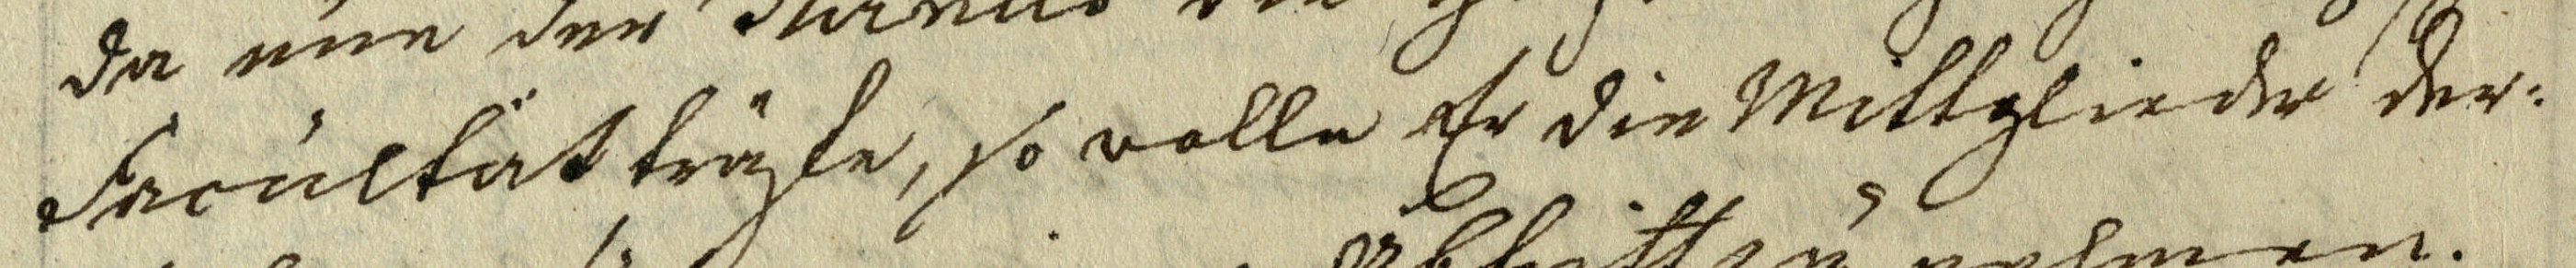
Facultät träfe, so wolle Er die Mittglieder der¬
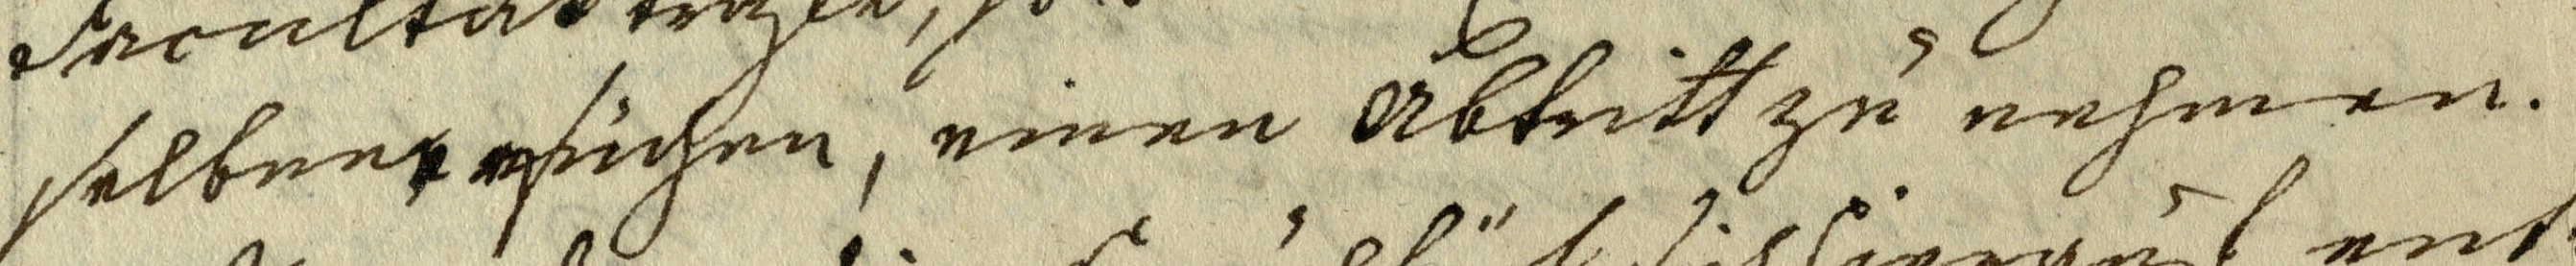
selben ersuchen, einen Abtritt zu nehmen.
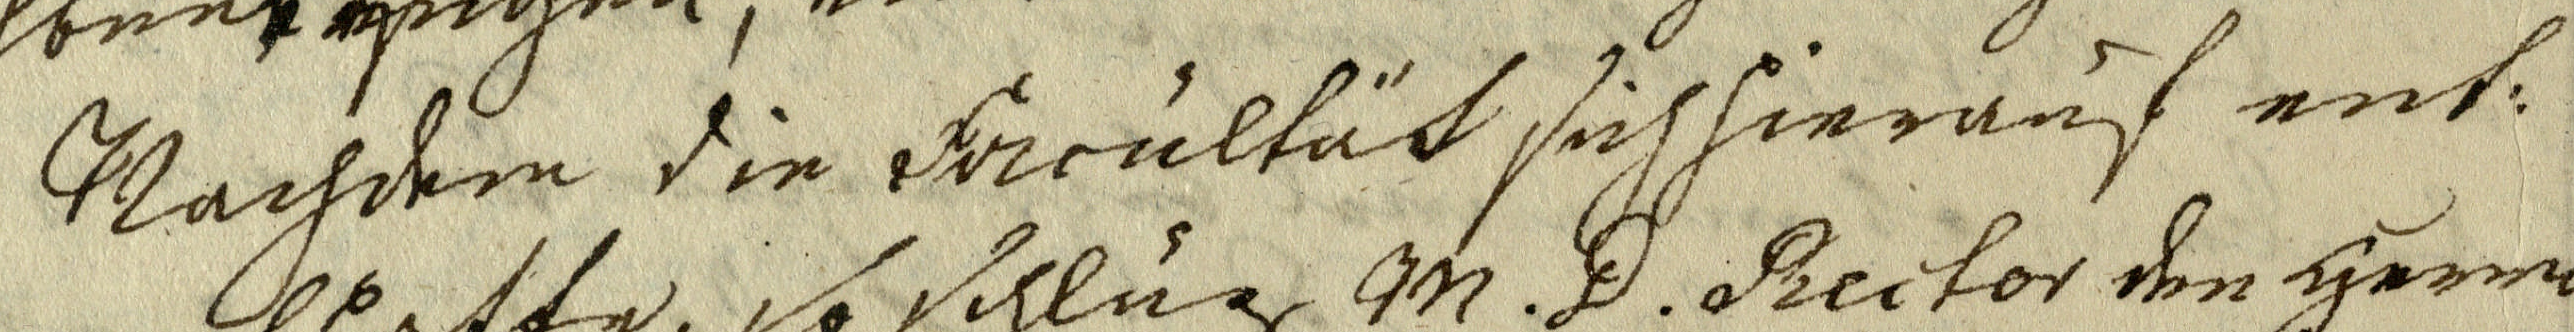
Nachdem die Facultät sich hierauf ent¬
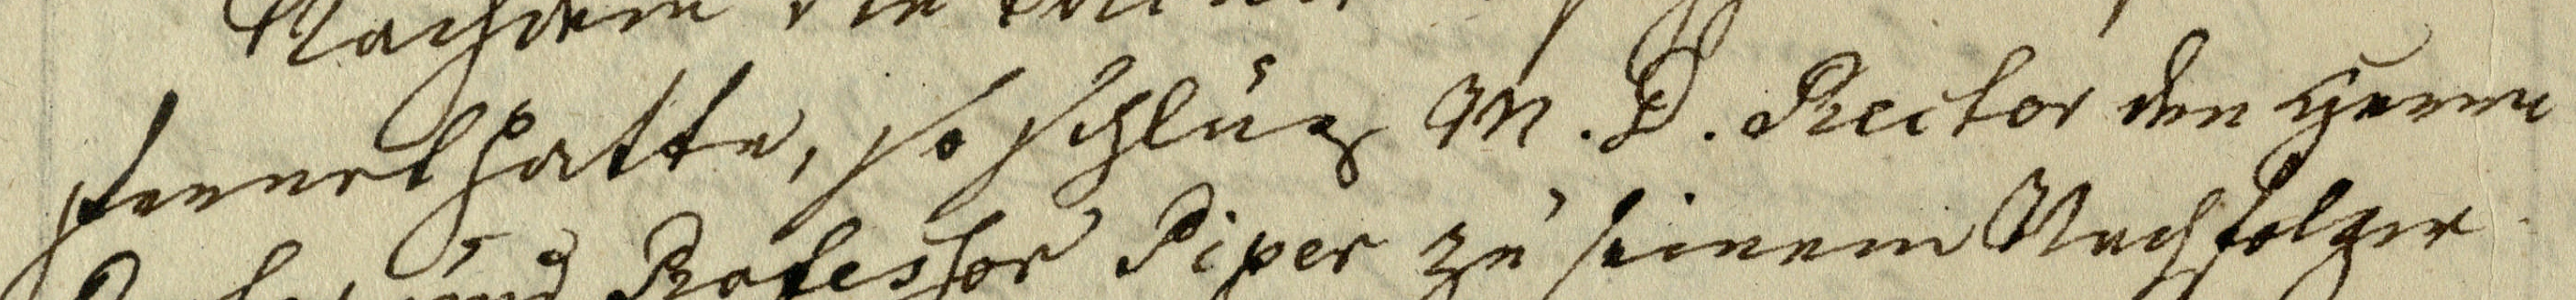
fernet hatte, so schlug M. D. Rector den Herrn
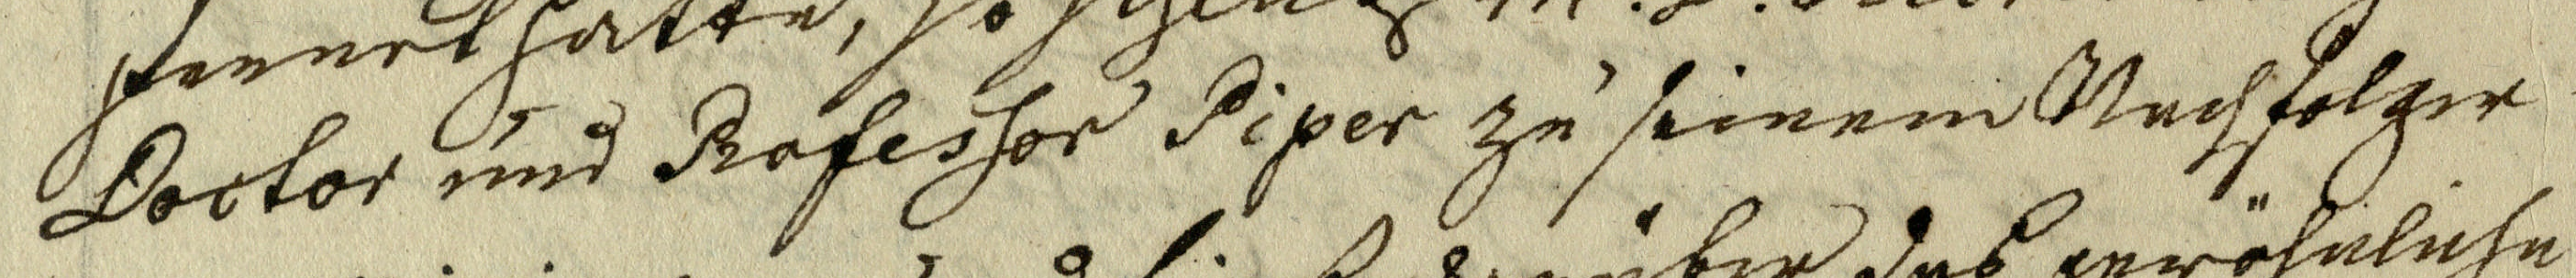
Doctor und Professor Piper zu seinem Nachfolger
